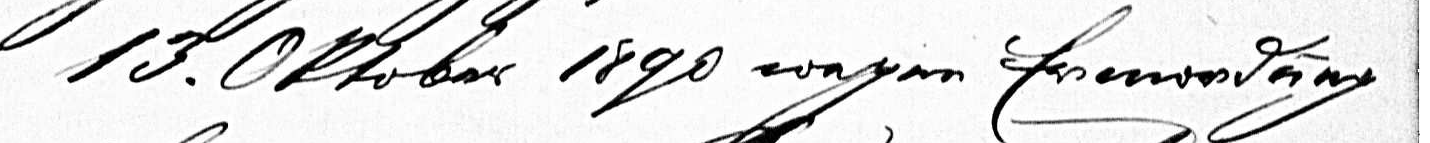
13. Oktober 1890 wegen Ermordung
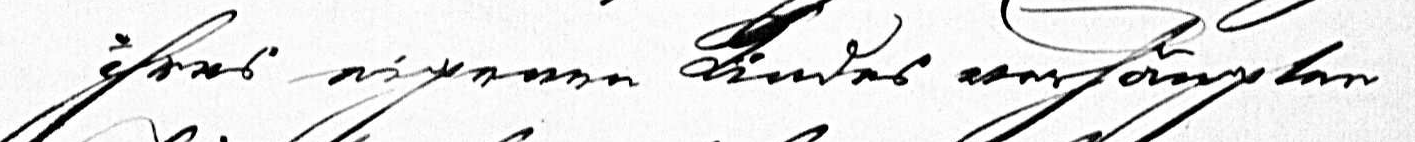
ihres eigenen Kindes verhängten
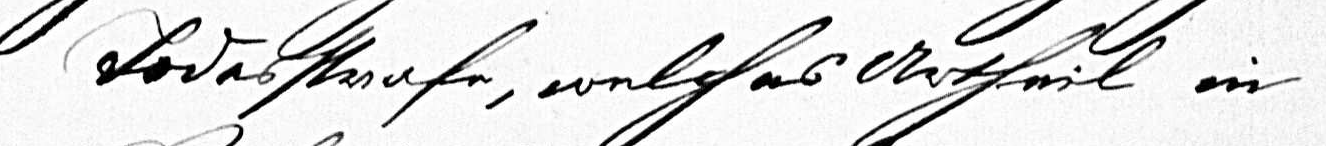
Todesstrafe, welches Urtheil in
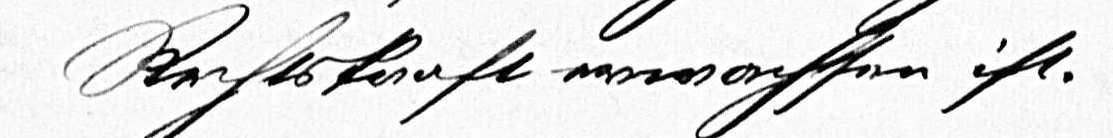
Rechtskraft erwachsen ist.
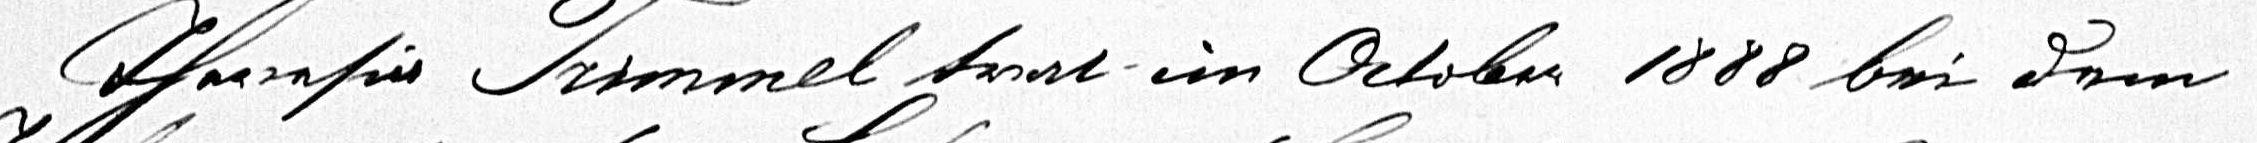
Theresia Trimmel trat im October 1888 bei dem
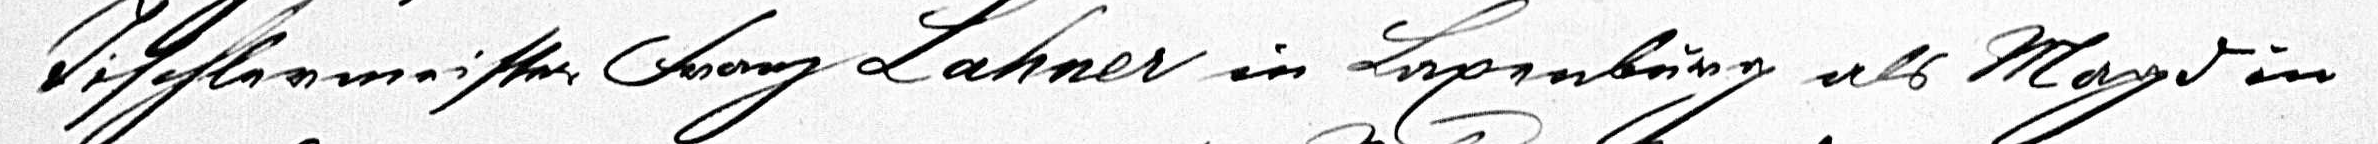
Tischlermeister Franz Lahner in Laxenburg als Magd in
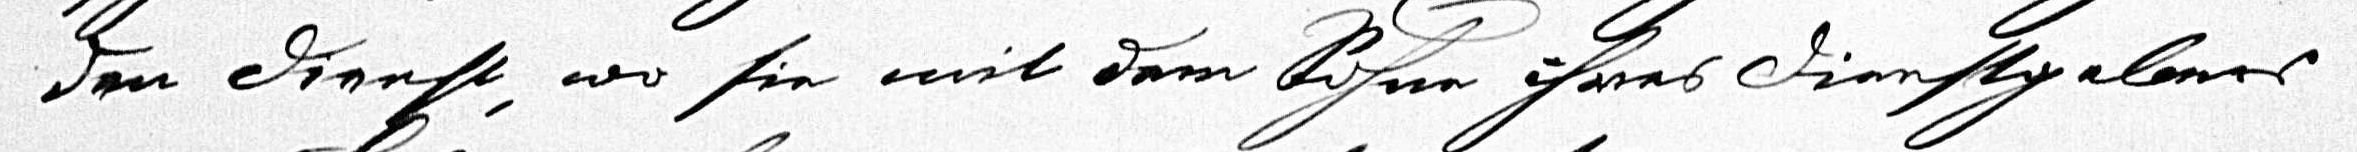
den Dienst, wo sie mit dem Sohne ihres Dienstgebers
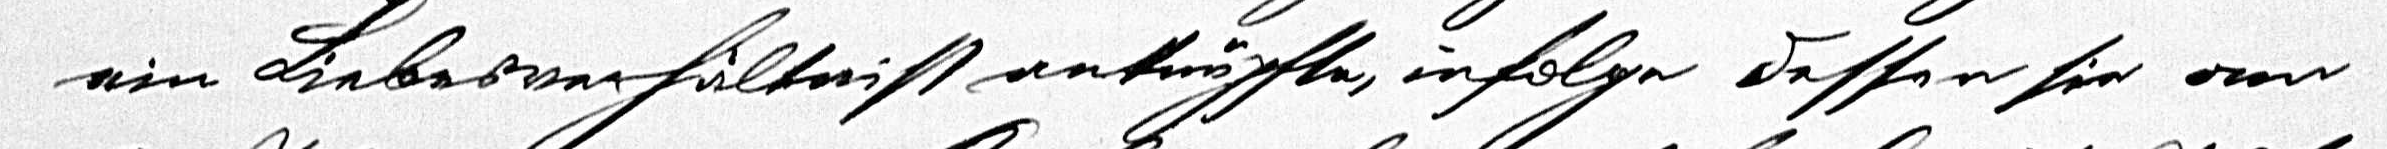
ein Liebesverhältniß anknüpfte, infolge dessen sie am
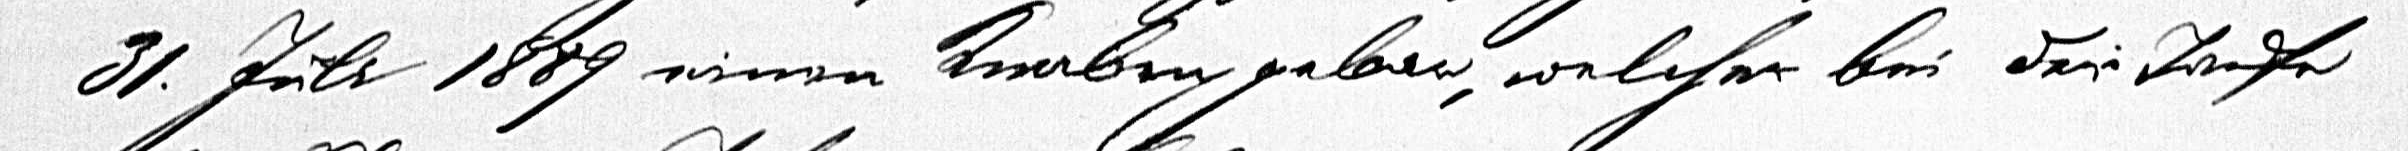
31. Juli 1889 einen Knaben gebar, welcher bei der Taufe
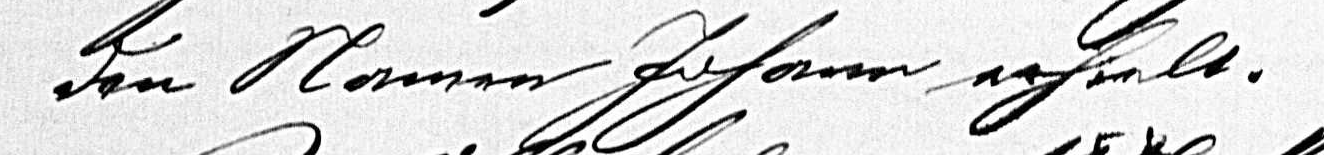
den Namen Johann erhielt.
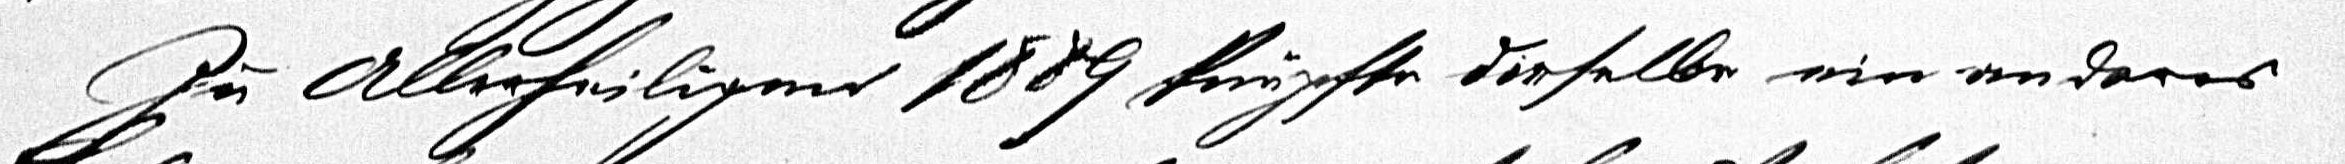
Zu Allerheiligen 1889 knüpfte dieselben ein anderes
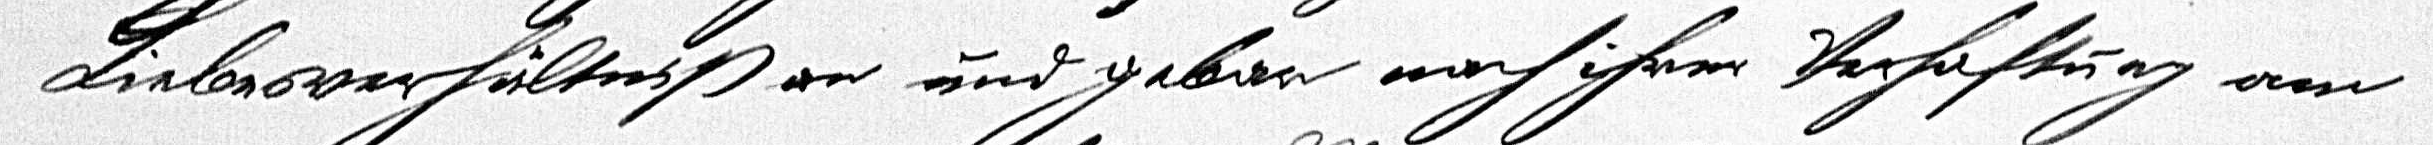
Liebesverhältniß an und gebar nach ihrer Verhaftung am
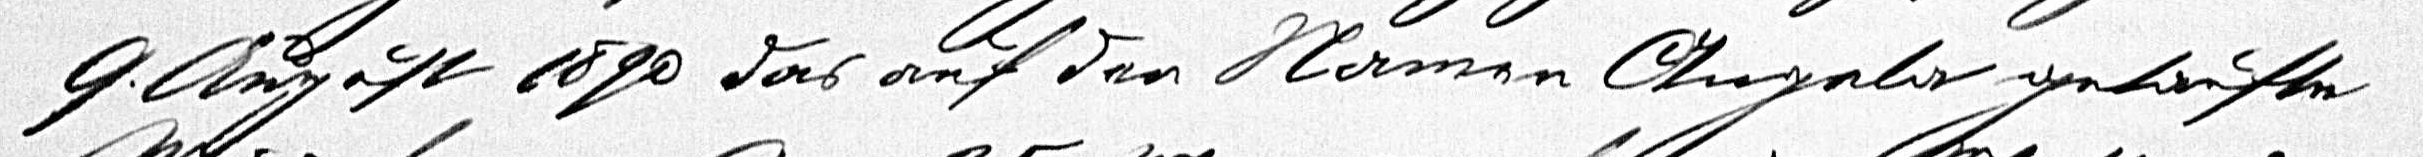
9. August 1890 das auf den Namen Angela getaufte
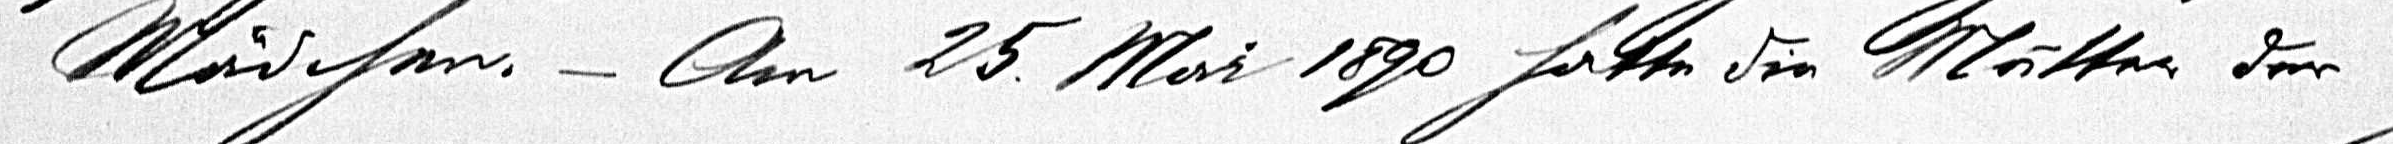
Mädchen.- Am 25. Mai 1890 hatte die Mutter der
